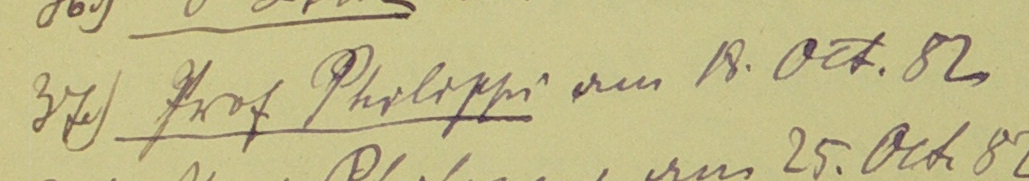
37.) Prof. Philippi am 25. Octob.82
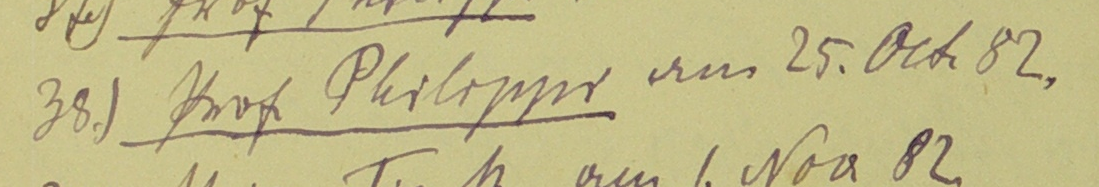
38.) Prof. Philippi am 25. Octob. 82
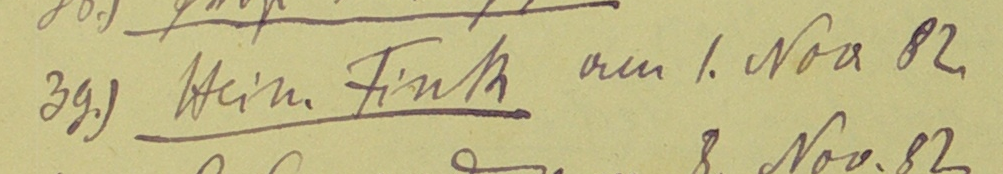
39.) Heinr. Fink am 1. Nov. 82
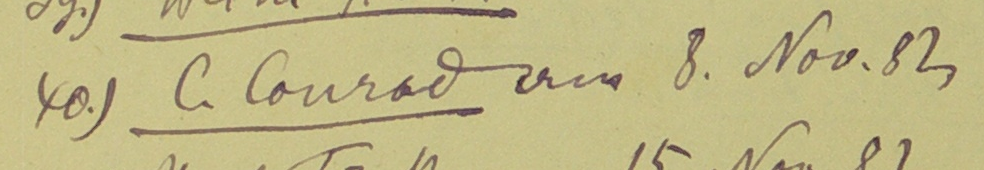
40.) C. Conrad am 8. Nov. 82
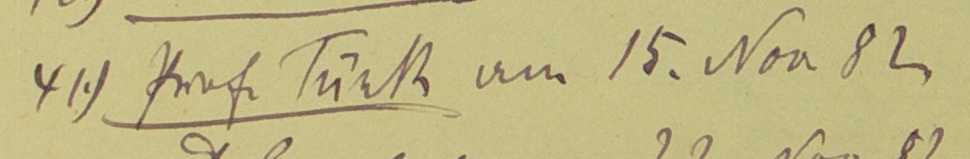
41.) Prof. Türk am 15. Nov. 82
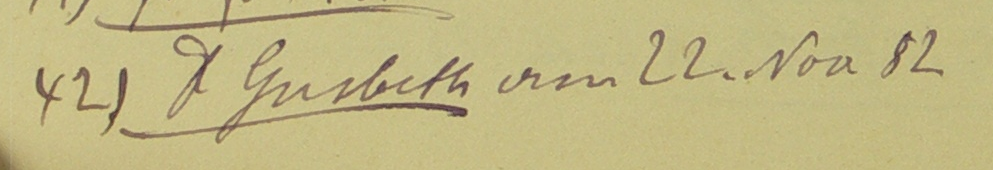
42.) Dr. Gusbeth am 22. Nov. 82
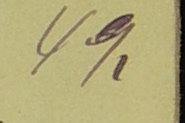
49
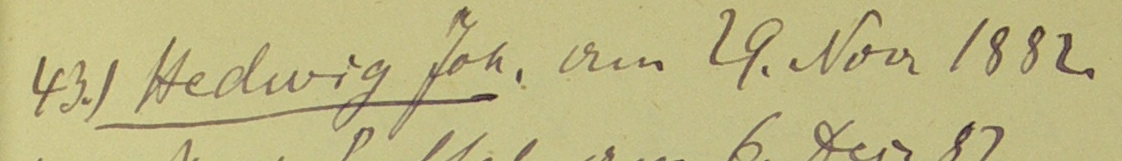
43.) Hedwig Joh. am 29.Nov 82
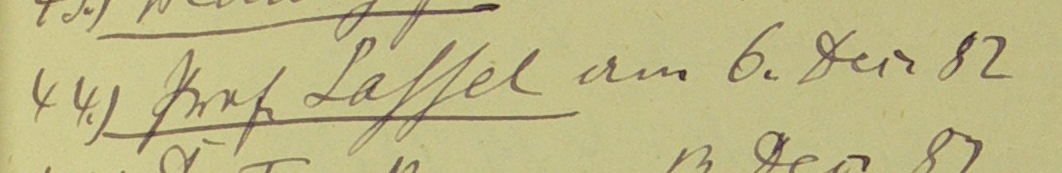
44.) Prof. Lassel am 6. Dec. 82
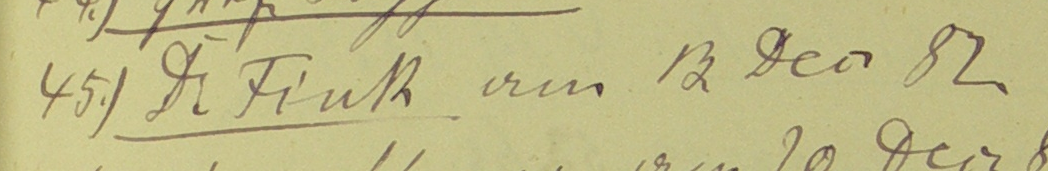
45.) Dr. Fink am 13. Dec. 82
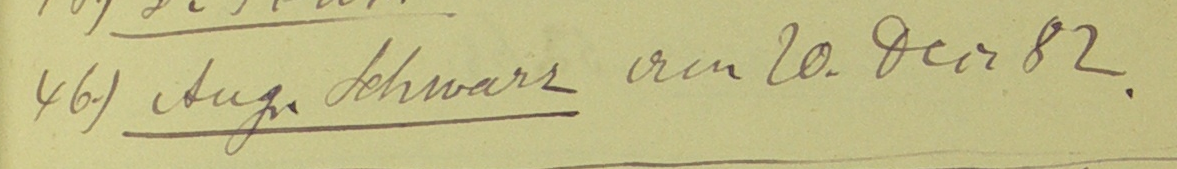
46.) Aug. Schwarz am 20. Dec. 82
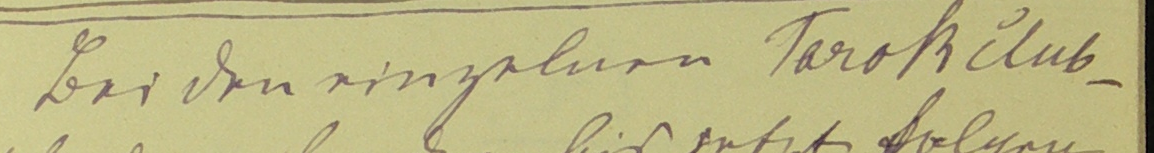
Bei den einzelnen Tarokclub¬
